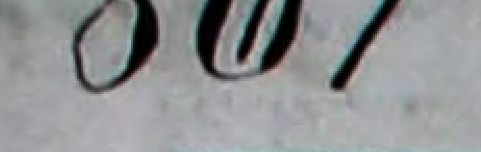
867
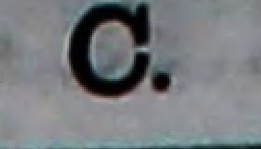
C.
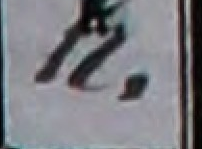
??.
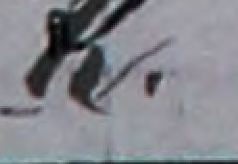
K.
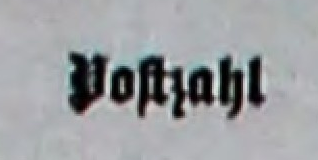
Postzahl
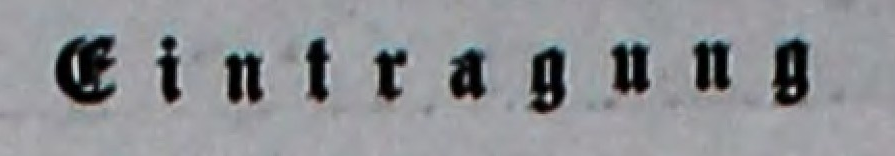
Eintragung
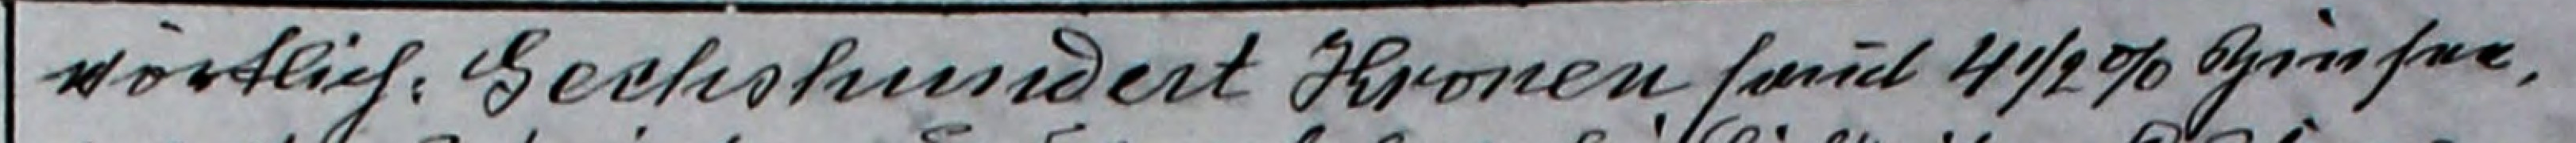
wörtlich: Sechshundert Kronen sammt 4 1/2% Zinsen,
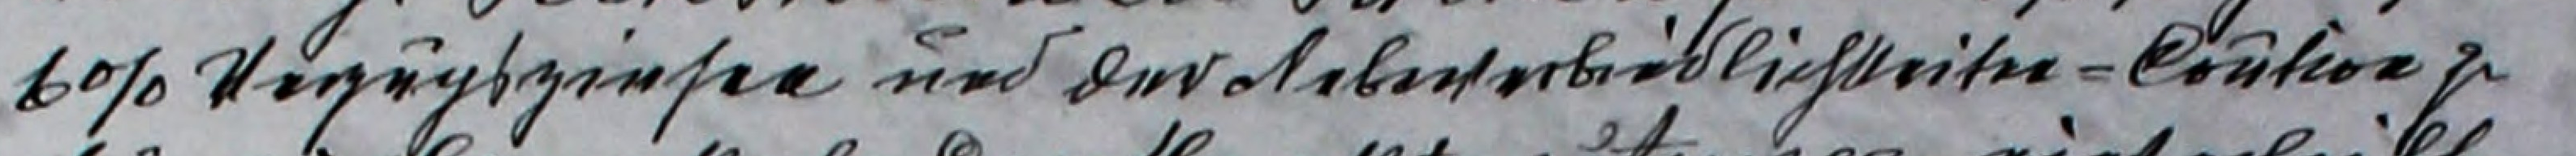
6% Verzugszinsen und der Nebeverbindlichkeiten = Caution pr
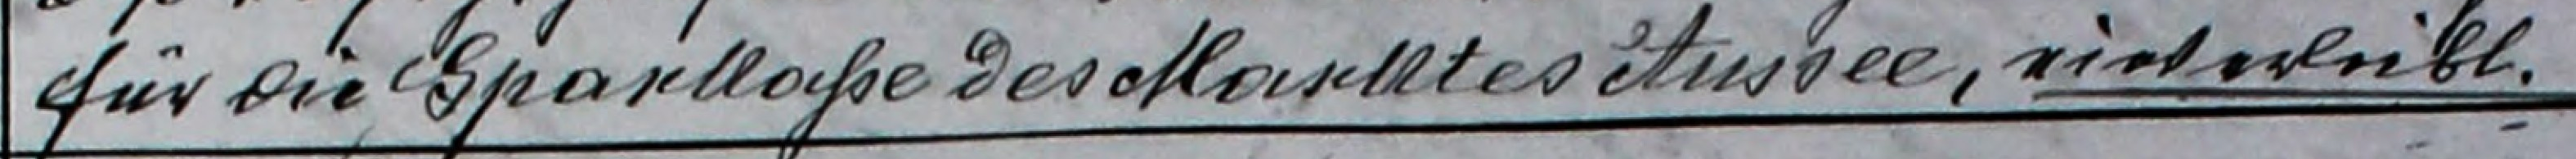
für die Sparkasse des Marktes Aussee, einverleibt.
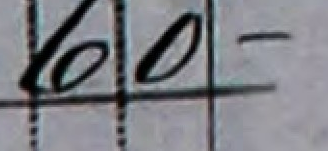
60-
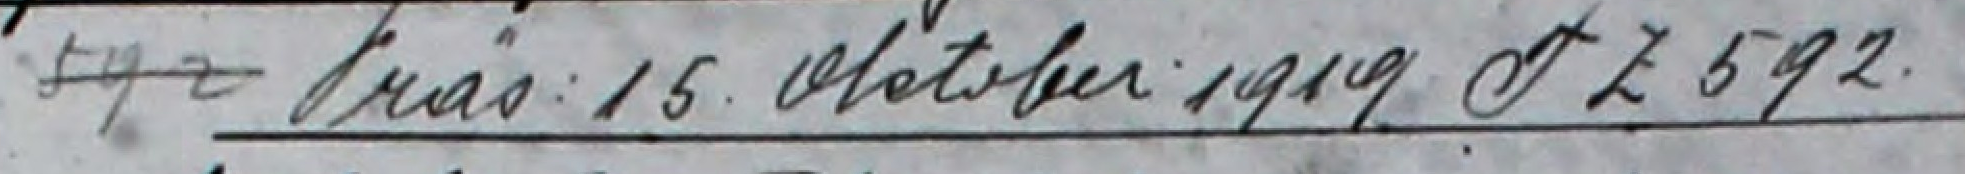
592 Präs: 15. Oktober 1919 T Z 592.
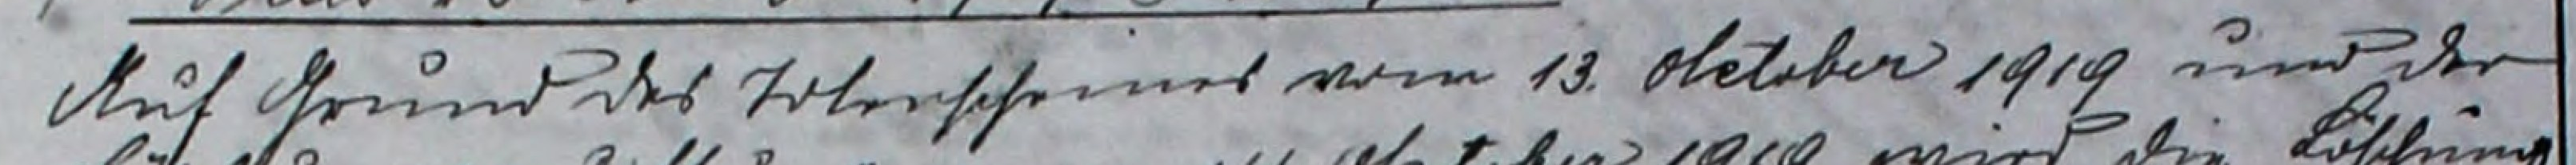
Auf Grund es Totenscheines vom 13. Oktober 1919 und der
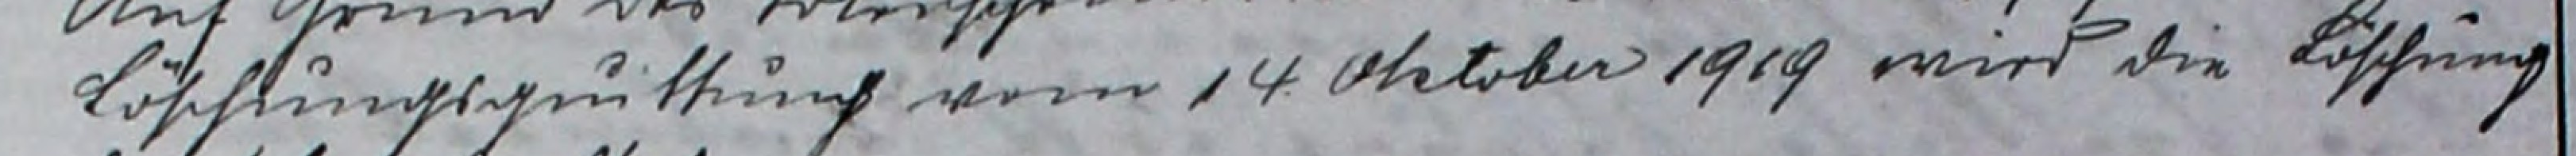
Löschungsquittung vom 14. Oktober 1919 wird die Löschung
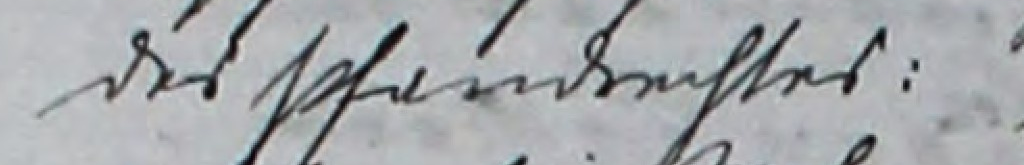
des Pfandrechtes:
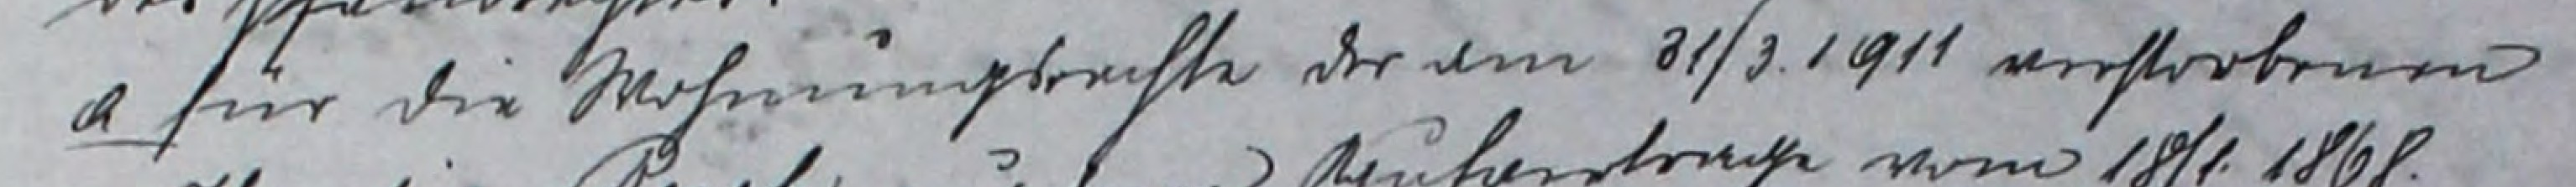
a für die Wohnungsrechte der am 31/3. 1911 verstorbenen
